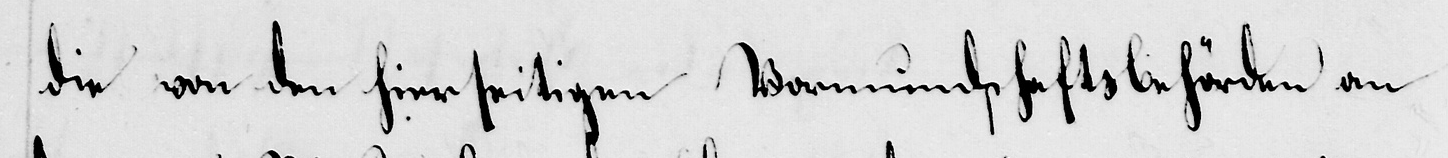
die von den hierseitigen Vormundschaftsbehörden an
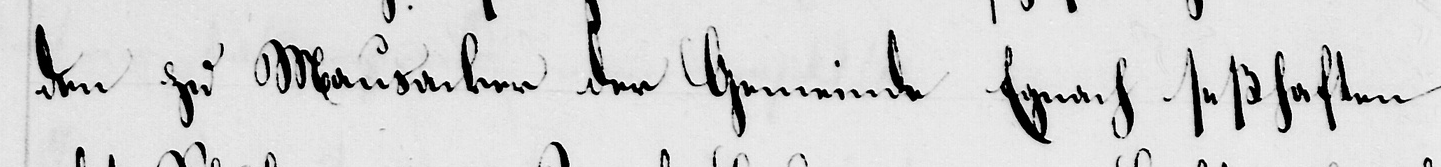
den zu Mausacker der Gemeinde Egnach seßhaften
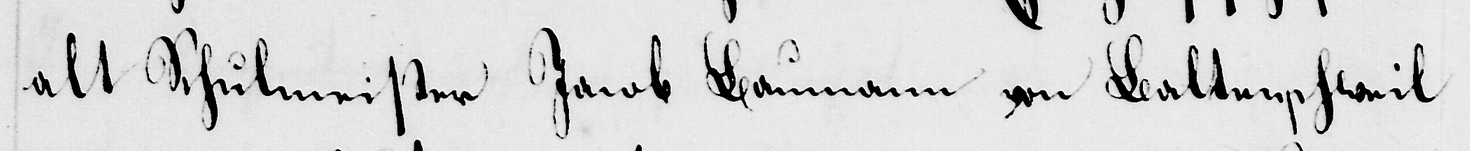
alt Schulmeister Jacob Baumann von Baltenschweil
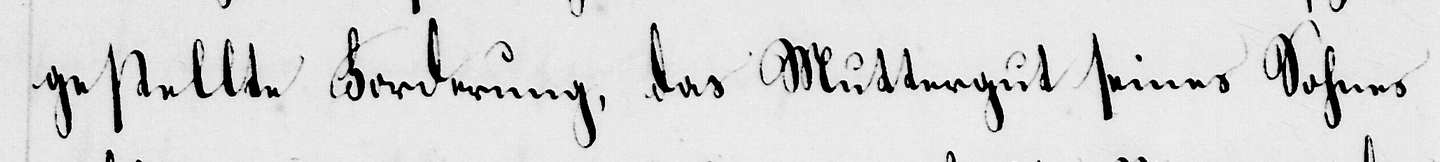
gestellte Forderung, das Muttergut seines Sohnes
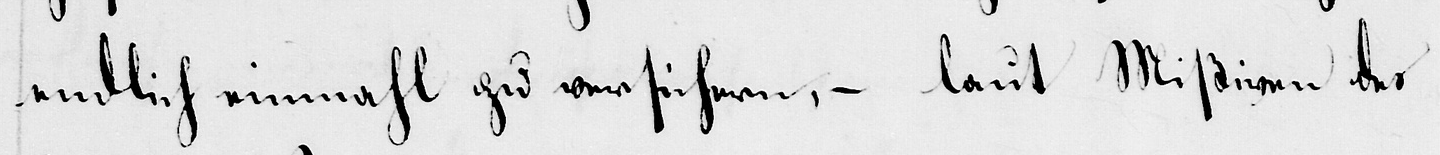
endlich einmahl zu versichern, – laut Mißiven des
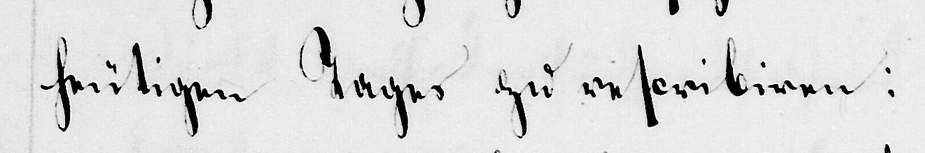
heutigen Tages zu rescribiren:
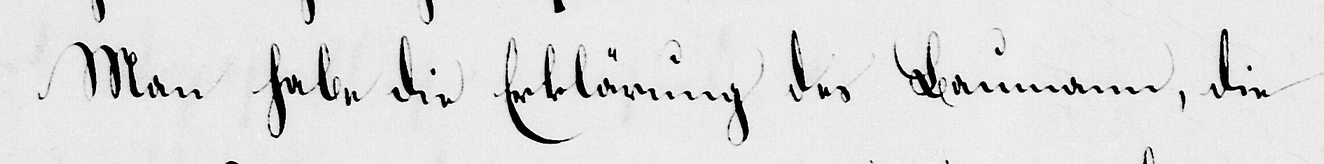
Man habe die Erklärung des Baumann, die
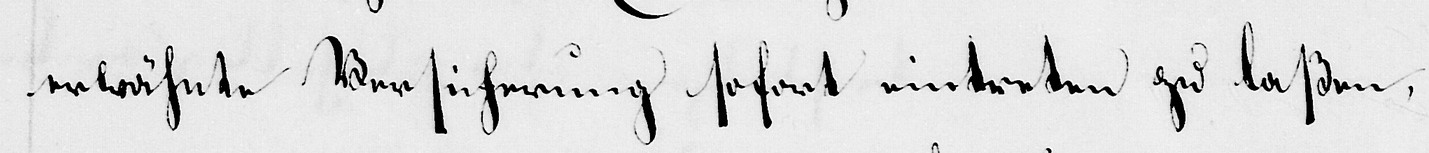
erwähnte Versicherung sofort eintreten zu laßen,
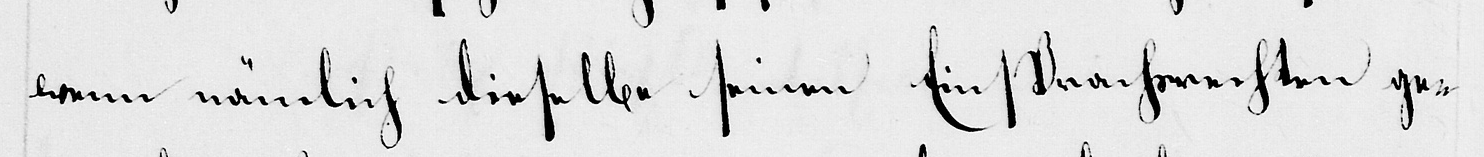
wenn nämlich dieselbe seinen Einsprachsrechten ge¬
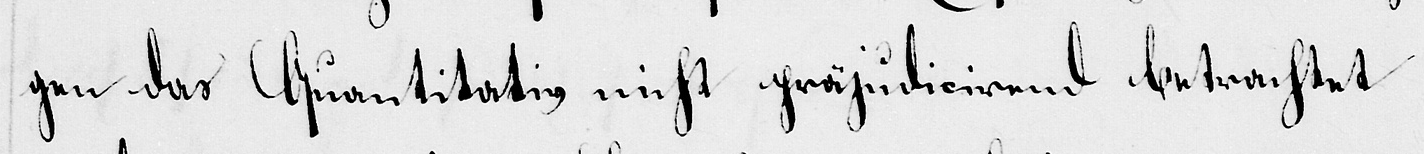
gen das Quantitativ nicht präjudicirend betrachtet
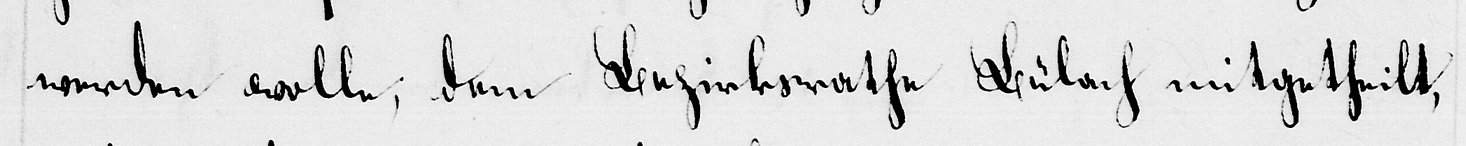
werden wolle, dem Bezirksrathe Bülach mitgetheilt,
